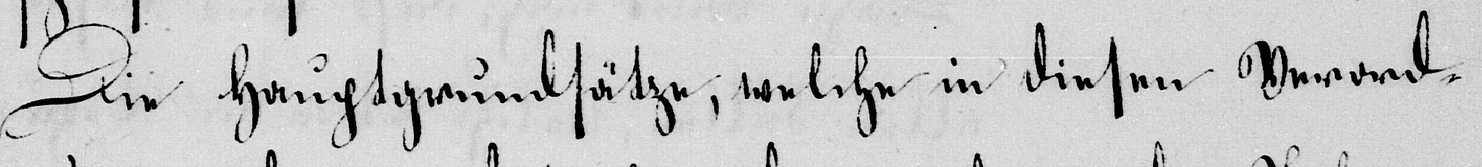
Die Hauptgrundsätze, welche in diesen Verord¬
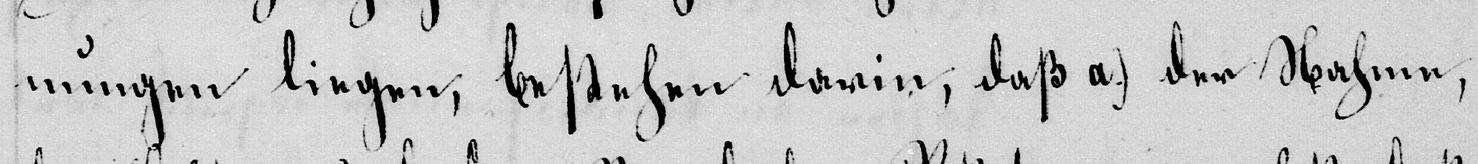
nungen liegen, bestehen darin, daß a.) der Nahme,
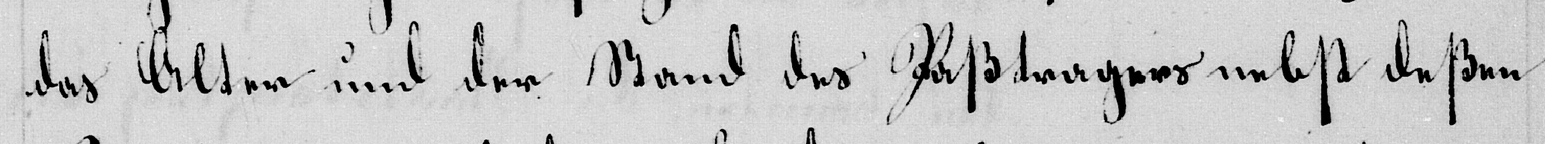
das Alter und der Stand des Paßtragers nebst deßen
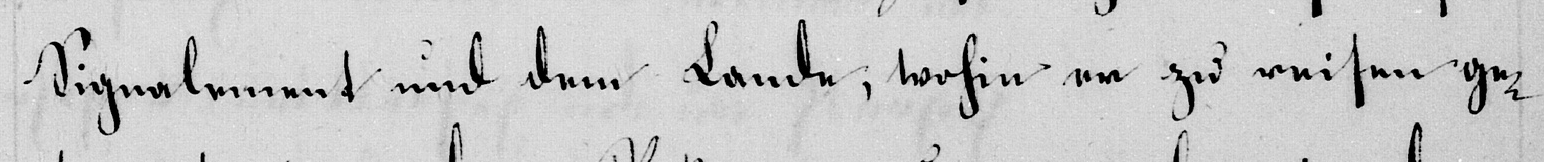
Signalement und dem Lande, wohin er zu reisen ge¬
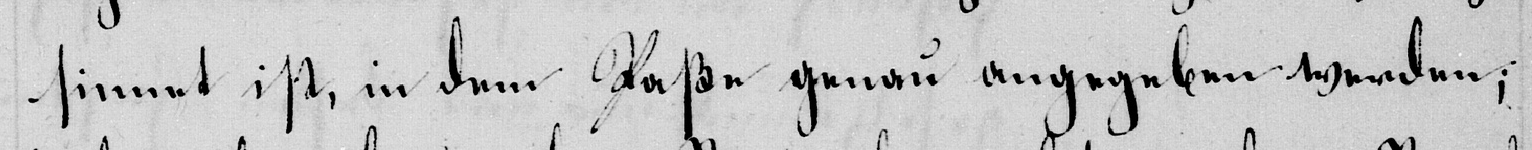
sinnt ist, in dem Paße genau angegeben werden;
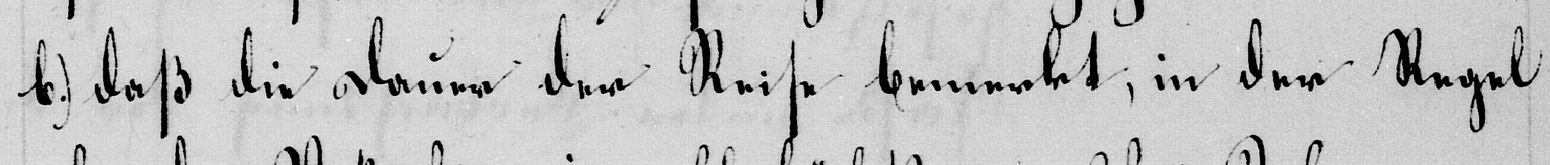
b.) daß die Dauer der Reise bemerkt, in der Regel
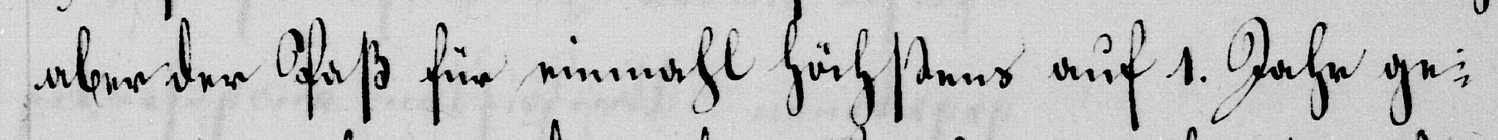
aber der Paß für einmahl höchstens auf 1. Jahr ge¬
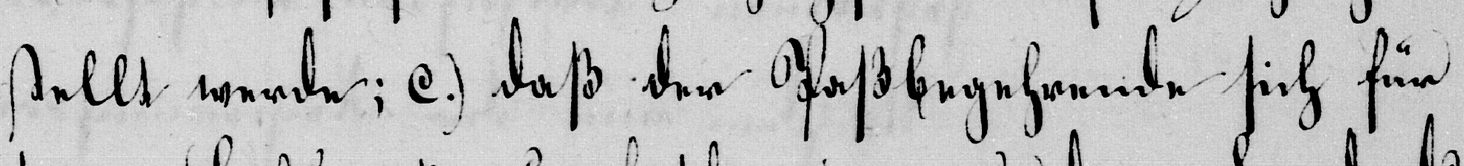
stellt werde; c.) daß der Paßbegehrende sich für
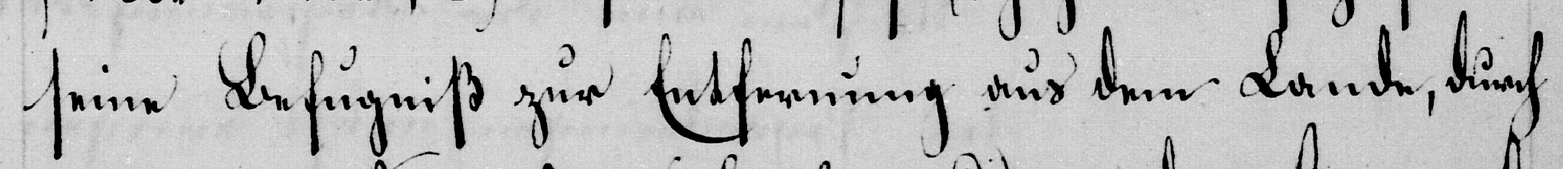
seine Befugniß zur Entfernung aus dem Lande, durch
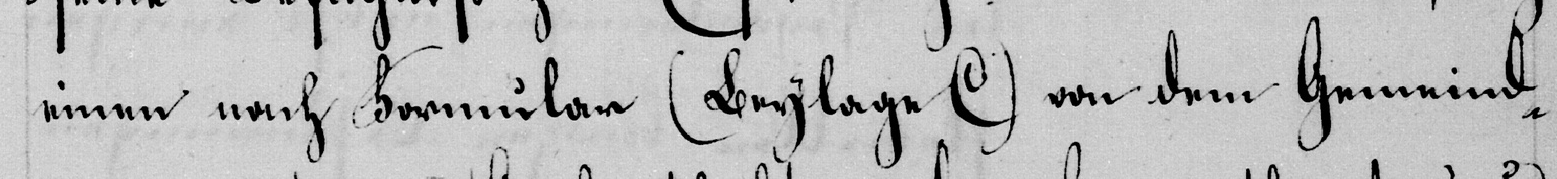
einen nach Formular (Beylage C) von dem Gemeind¬
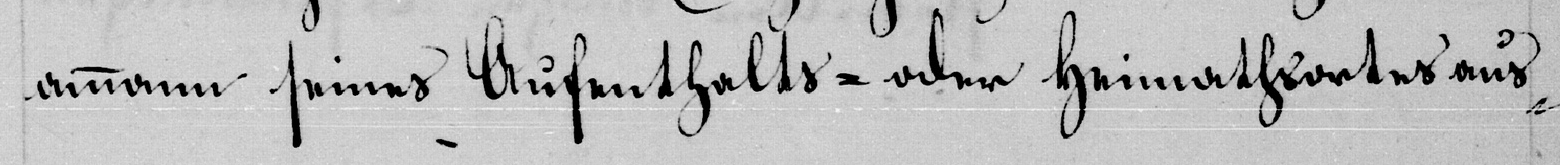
ammann seines Aufenthalts- oder Heimathsortes aus-
